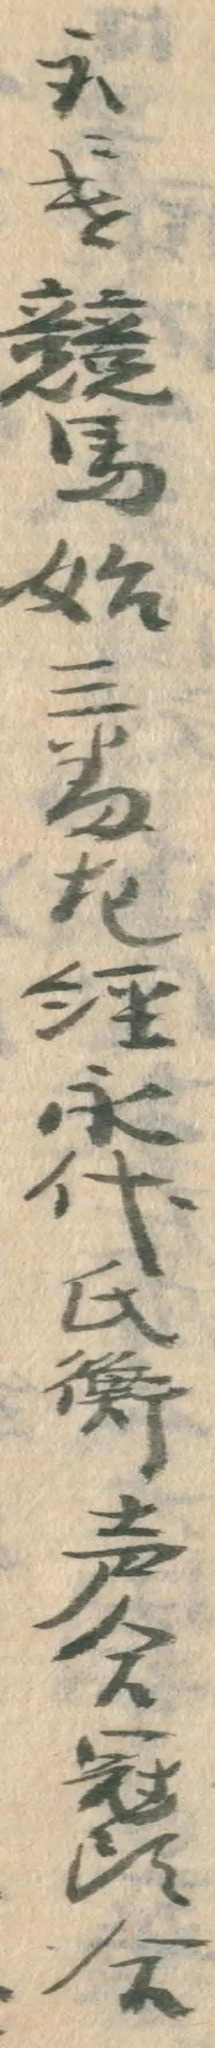取に遣、競馬始、三番左経永代氏衡、声合冠改合
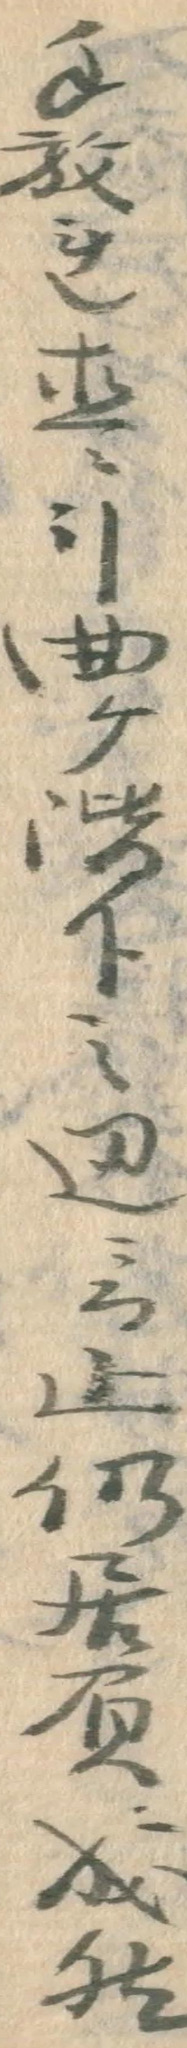放れ直に引曲ケ階下之辺ニ而止、仍居負に成、然
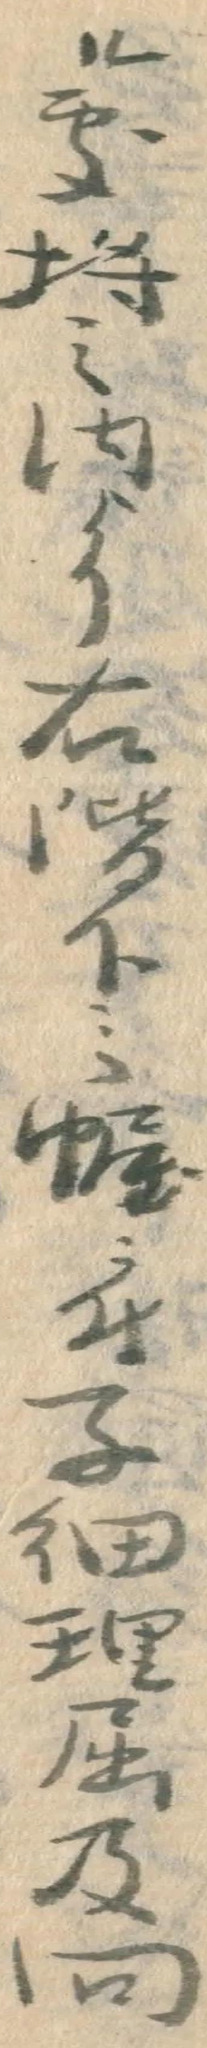候處埒之内より右階下之幄ニ付、子細理屈及問
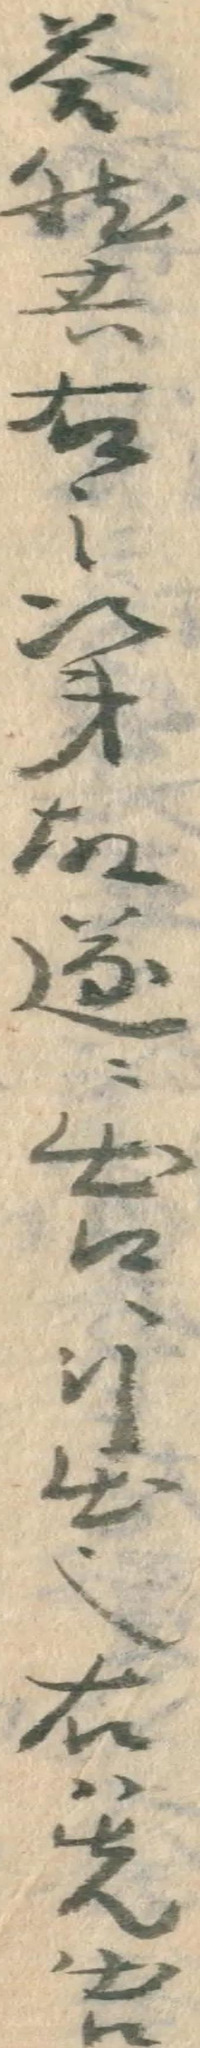答、然共右之次第故、遂に出口へ引出也、右ハ先出口
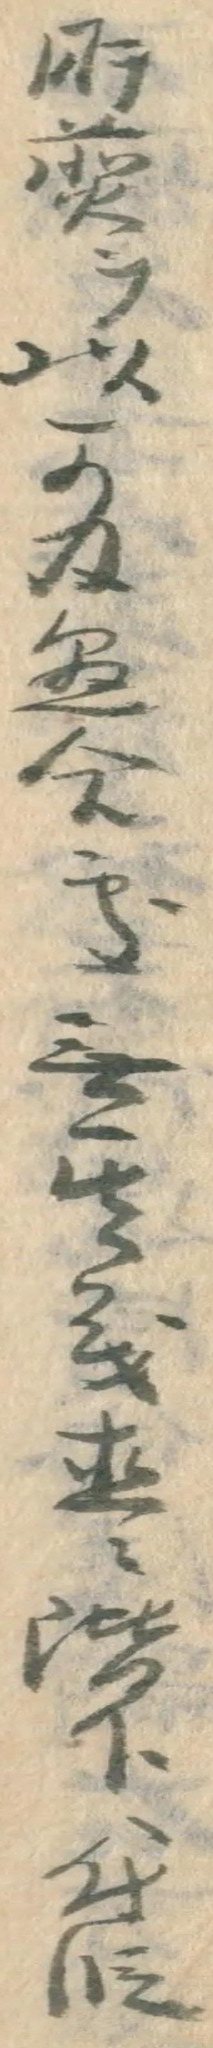肝煎ヲ以可及合處、無其義直ニ階下へ付段

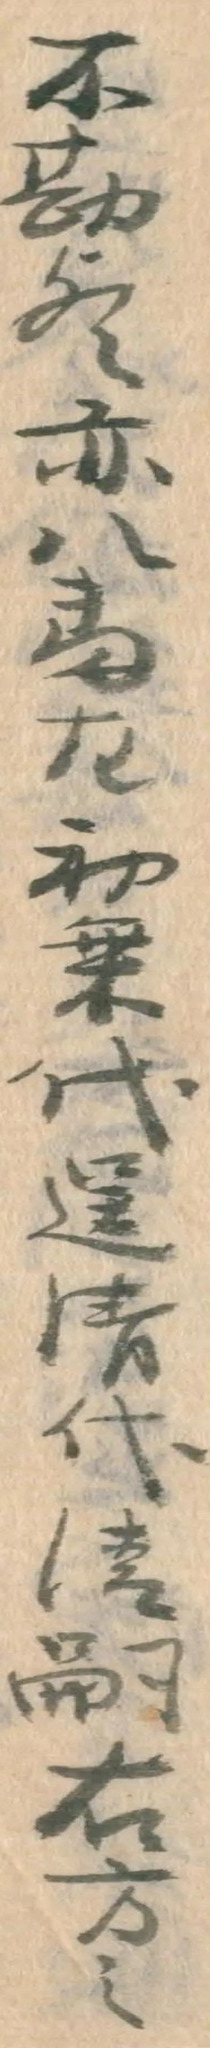不勘歟、亦八番左初乗代逞清代清嗣、右方之
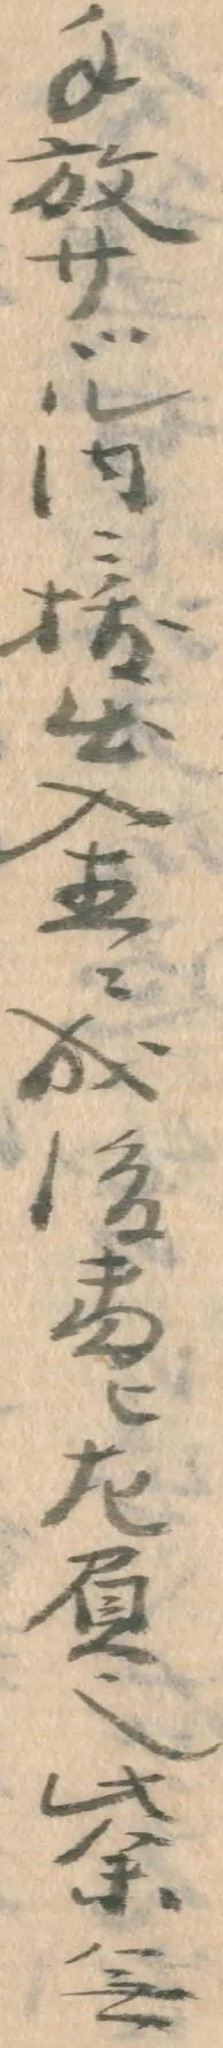手放サヾル内ニ指出、入直ニ成、後番被左負也、此余無
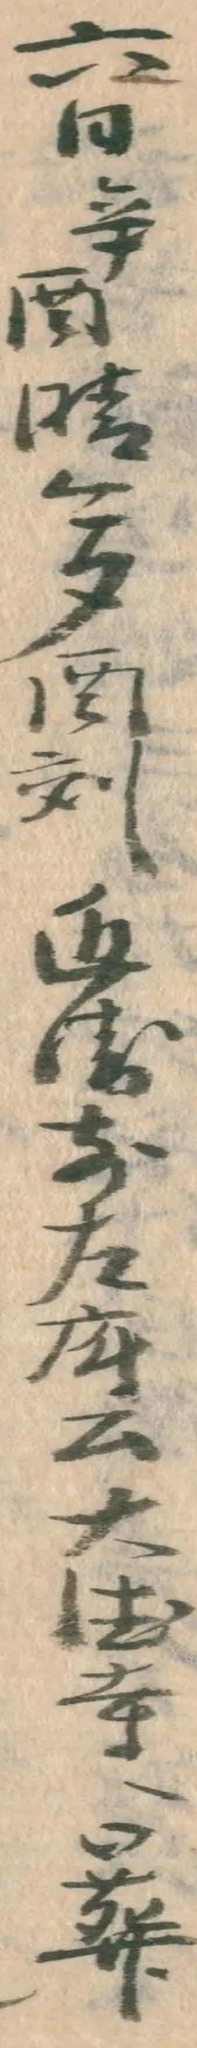六日辛酉晴、今夕酉刻近衛前左府公大徳寺へ御葬
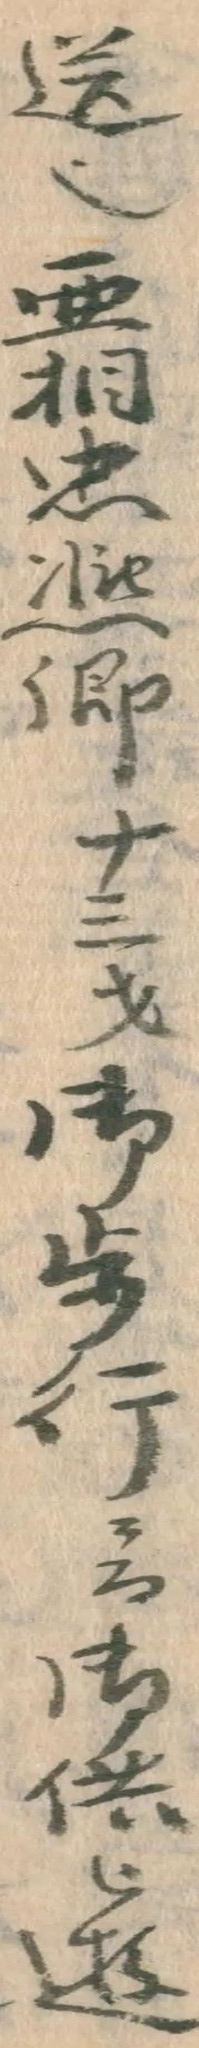送也、亜相忠熙卿十三才、御歩行ニ而御供被遊、
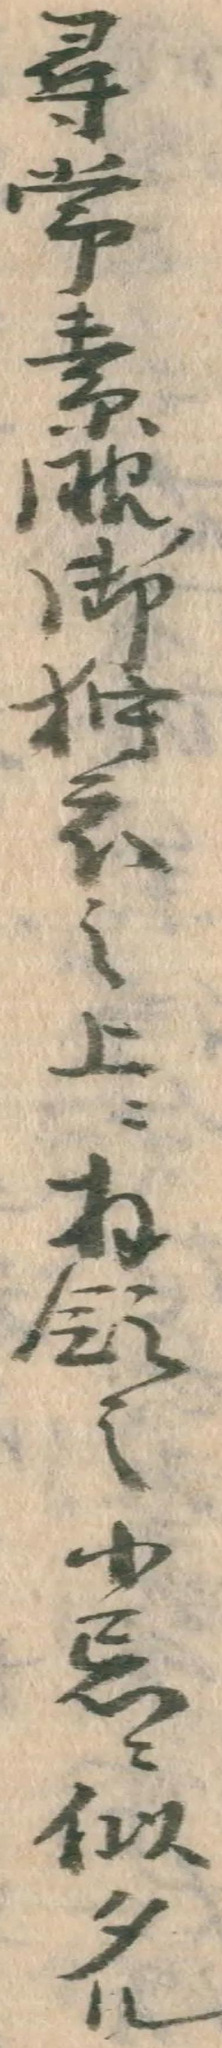尋常素服ノ御狩衣之上ニ拝領之小忌ニ似タル
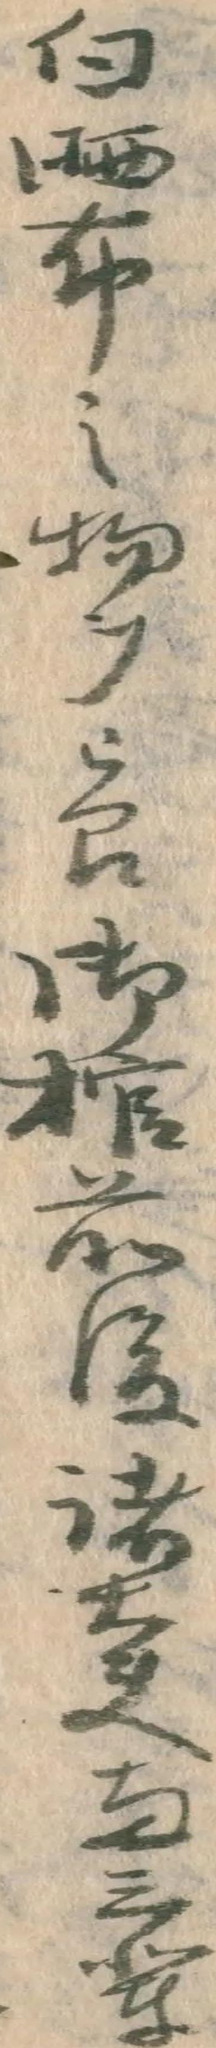白晒布之物ヲ被召、御棺前後、諸大夫両三輩、
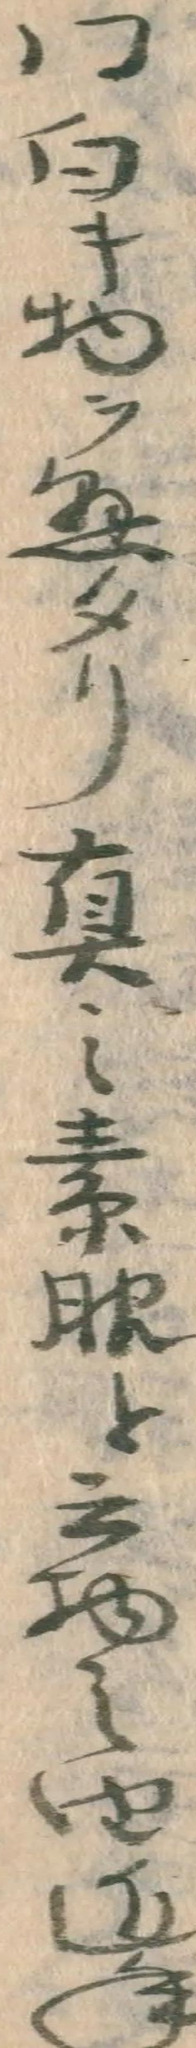同白キ物ヲ懸タリ、真之素服ト云物之由、近年
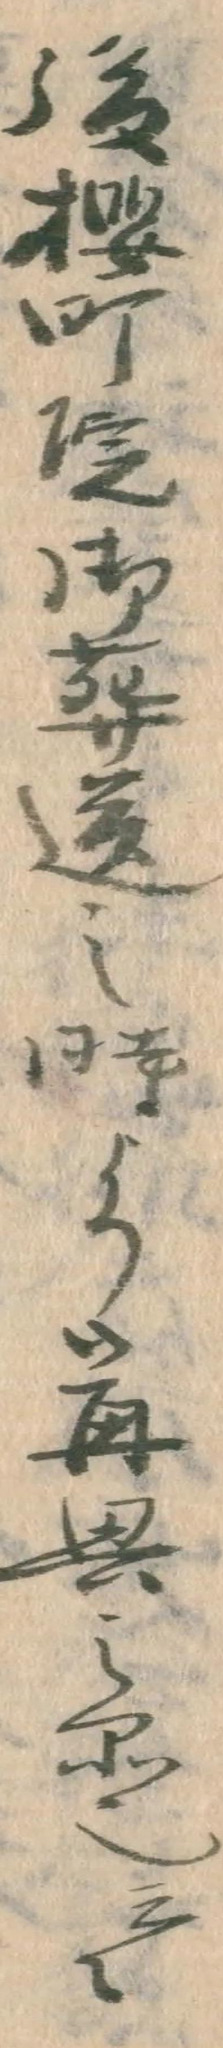後櫻町院御葬送之時より御再興之品也云々、
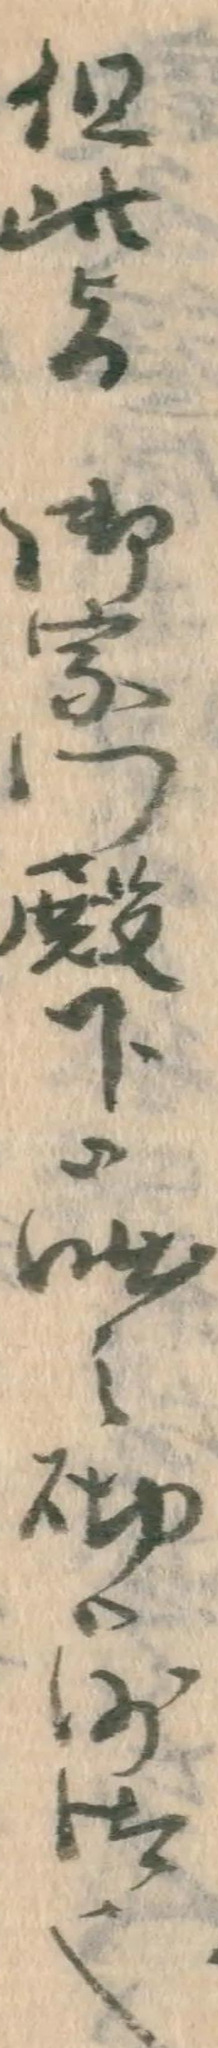但此旨御家門殿下御咄之砌御沙汰也、
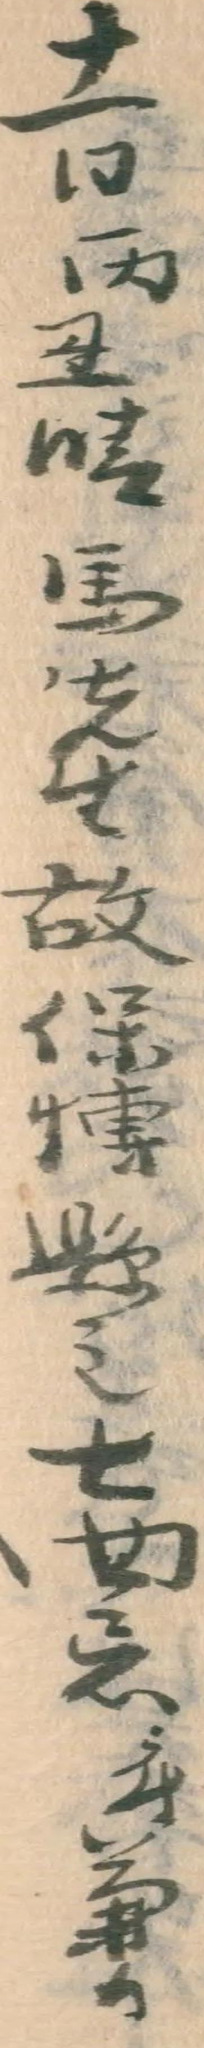十一日丙丑晴、馬先生故保博縣主七回忌ニ付、兼而
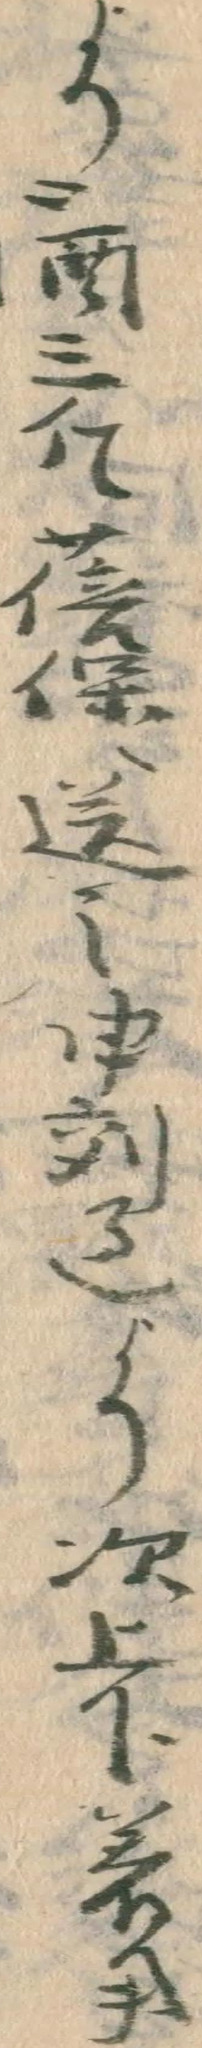より御酒三斤、蓓保へ送之、申刻過より次上下着用、
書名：賀茂社記録. 第63冊
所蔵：国立国会図書館 National Diet Library, JAPAN
